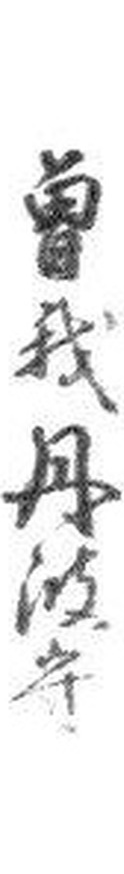曽我丹波守
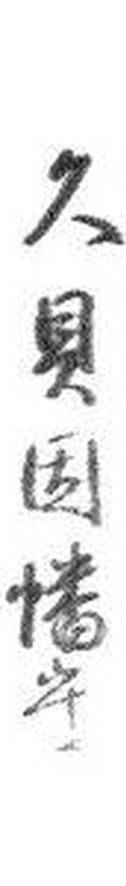久貝因幡守
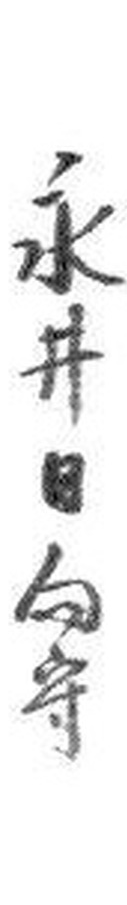永井日向守

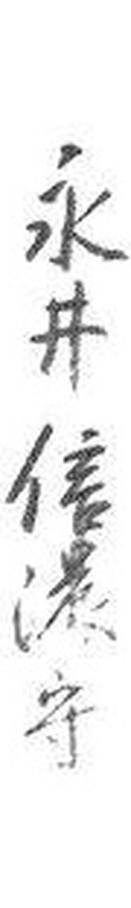永井信濃守
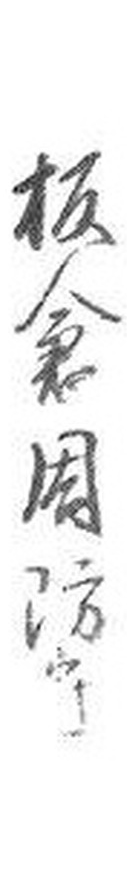板倉周防守
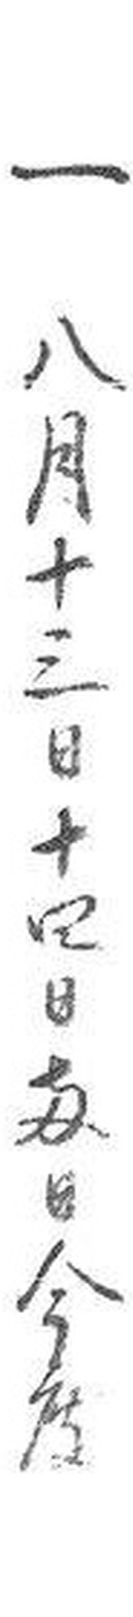一八月十三日十四日両日今度
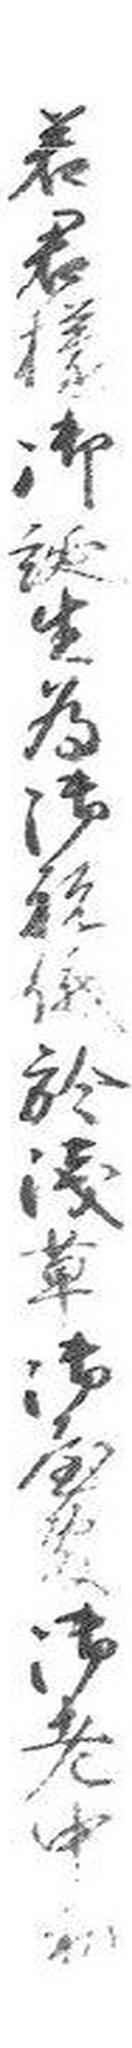若君様御誕生為御祝儀於浅草御屋敷御老中初
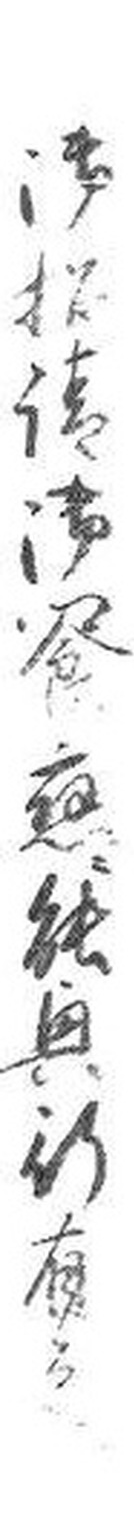御招請御饗応ニ能興行有之
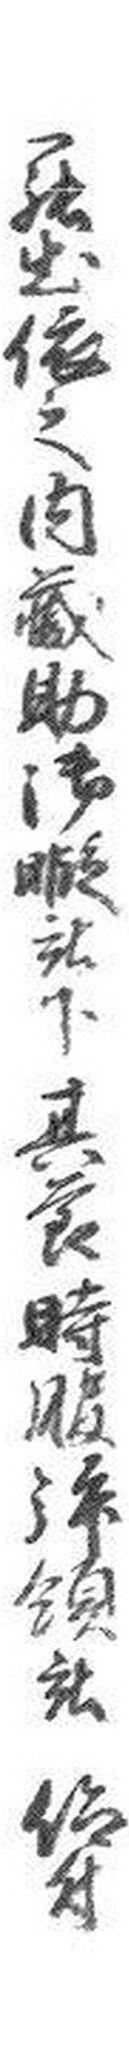罷出依之内蔵助御暇被下其節時服拝領被仰付
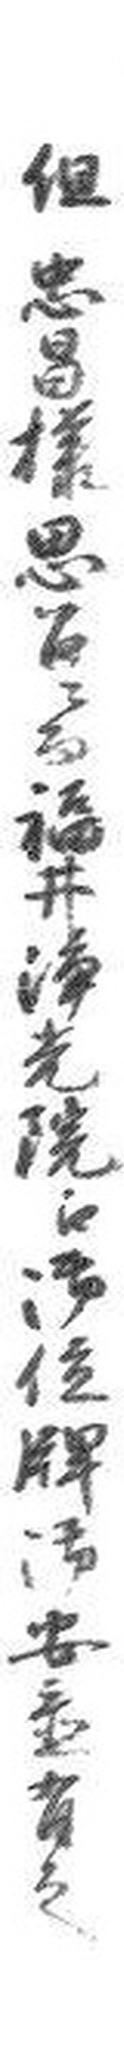但忠昌様思召ニ而福井浄光院江御位牌御安置有之
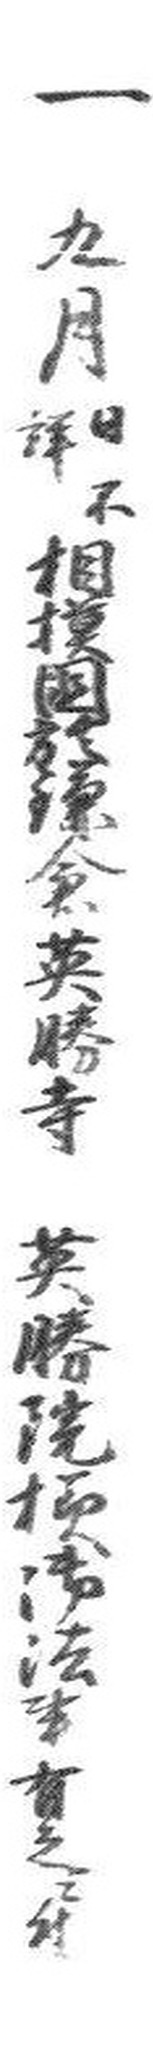一九月日不詳相模国於鎌倉英勝寺英勝院様御法事有之ニ付
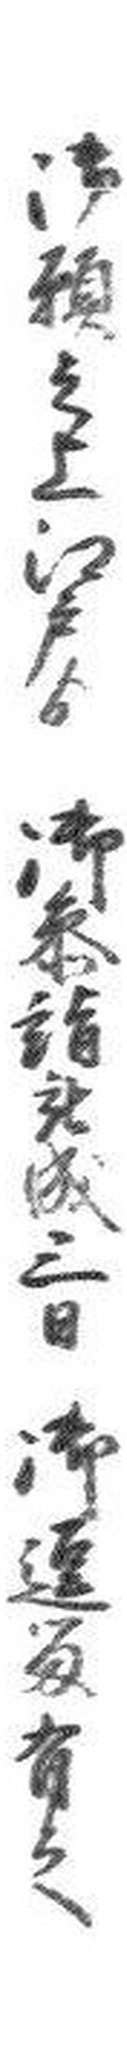御願之上江戸ゟ御参詣被成三日御逗留有之
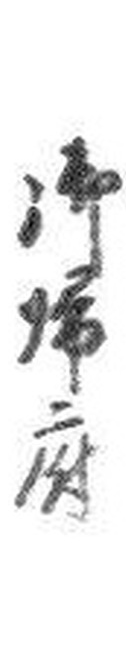御帰府
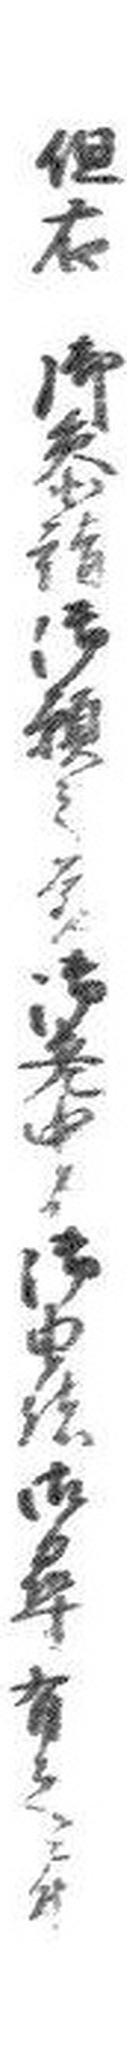但右御参詣御願之節御老中ゟ御由緒御尋有之ニ付
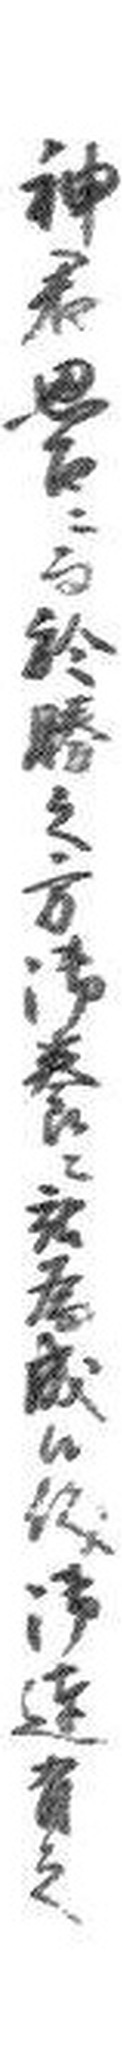神君思召ニ而於勝之方御養ニ被為成候儀御達有之

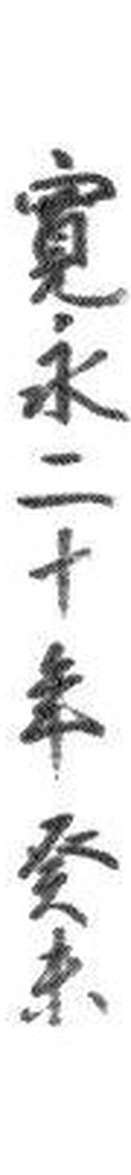寛永二十年癸未
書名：家譜 四 忠昌公 従寛永七年到正保四年
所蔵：福井県文書館 Fukui Prefectural Archives
